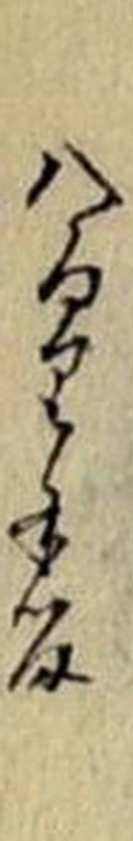八百里手留
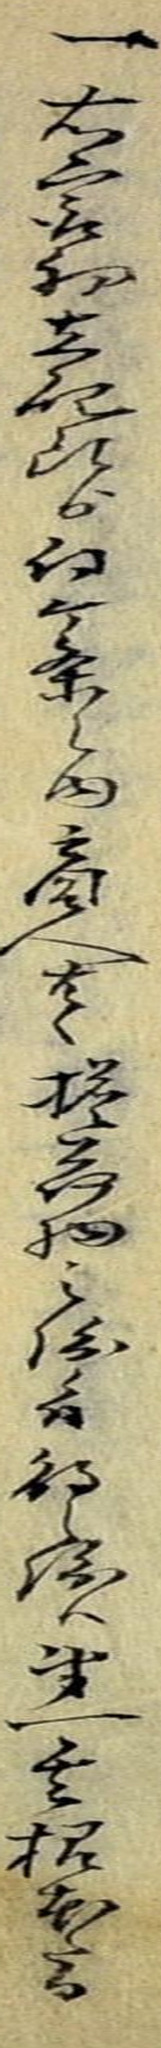一右最初支配頭ゟ何ヶ条之内商人共へ担荷物之儀に付触候儀は第一其根本たる
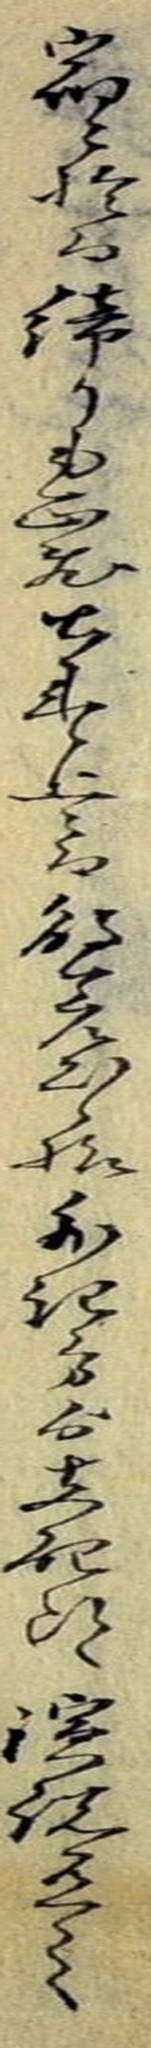宿に於而締りも正敷出来候上に而触差出候様外記方ゟ支配頭へ演説有之
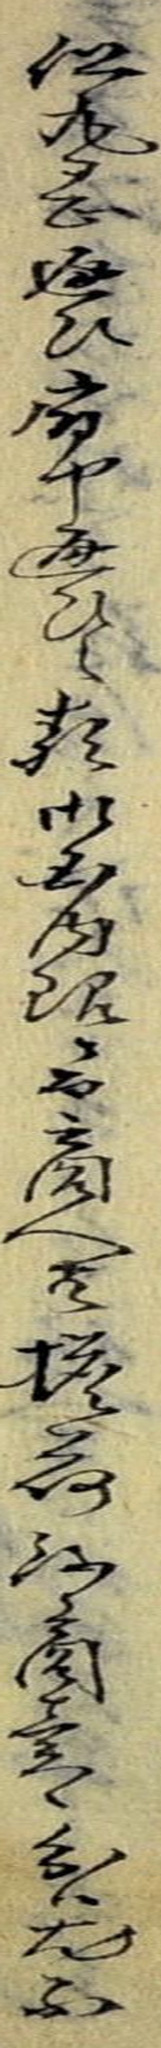但丸岡通行府中通行之類御国内限に而商人共担荷致商売候分は尤不
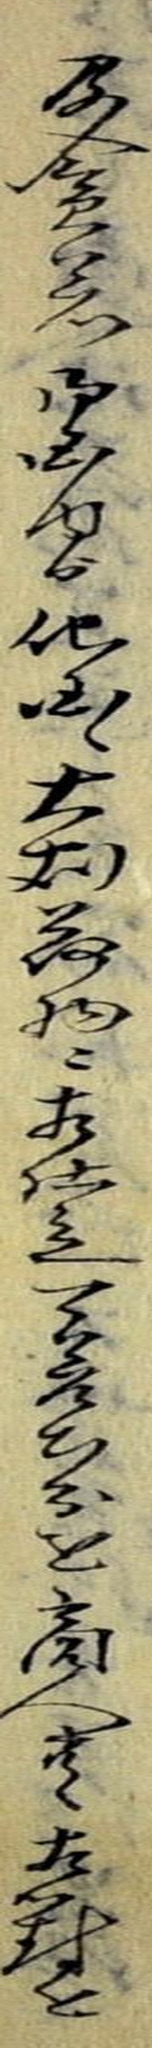及貪着御国内ゟ他国へ大判荷物に相仕立可差出分を商人共へ相対を
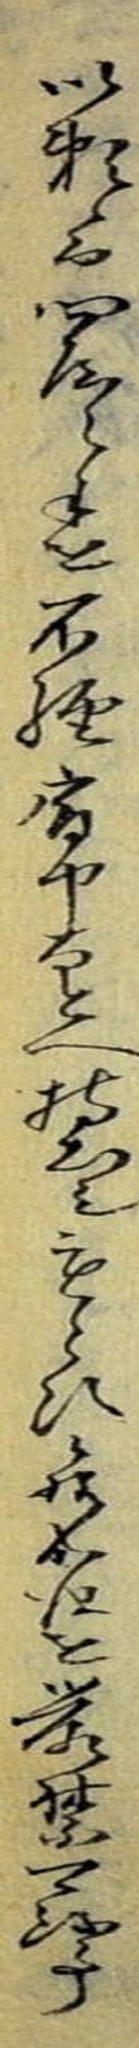以頼候而問屋之手を不経府中なとへ持出しもらす候様成儀を厳禁可致事
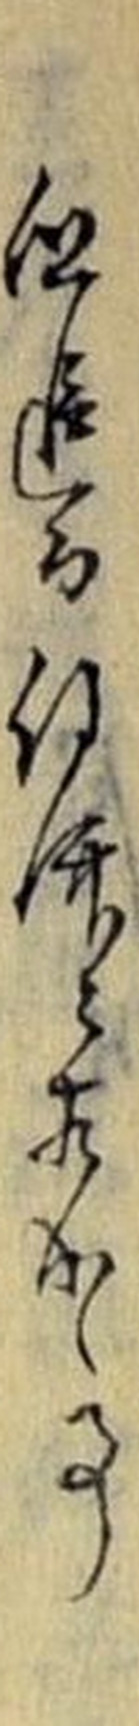但追而伺済に相成候事
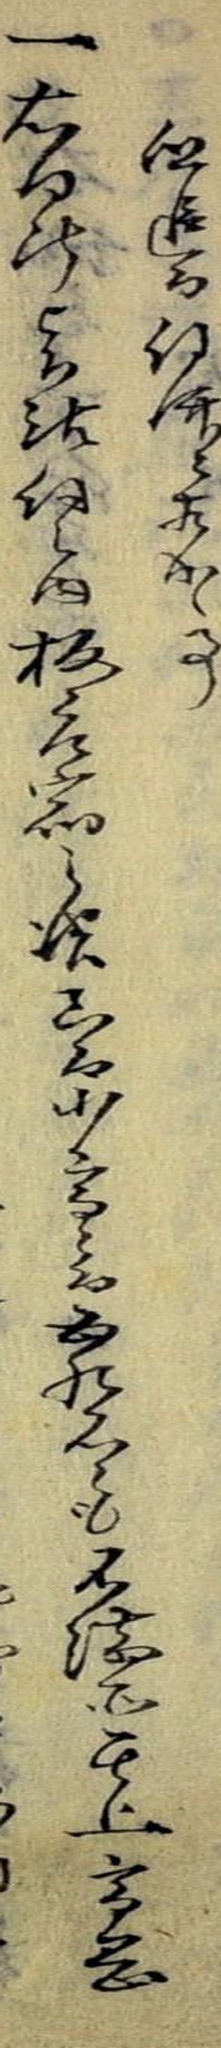一右同断被下銀伺之内板取宿之儀は至而少高に而五拾石にも不満所其上高岡
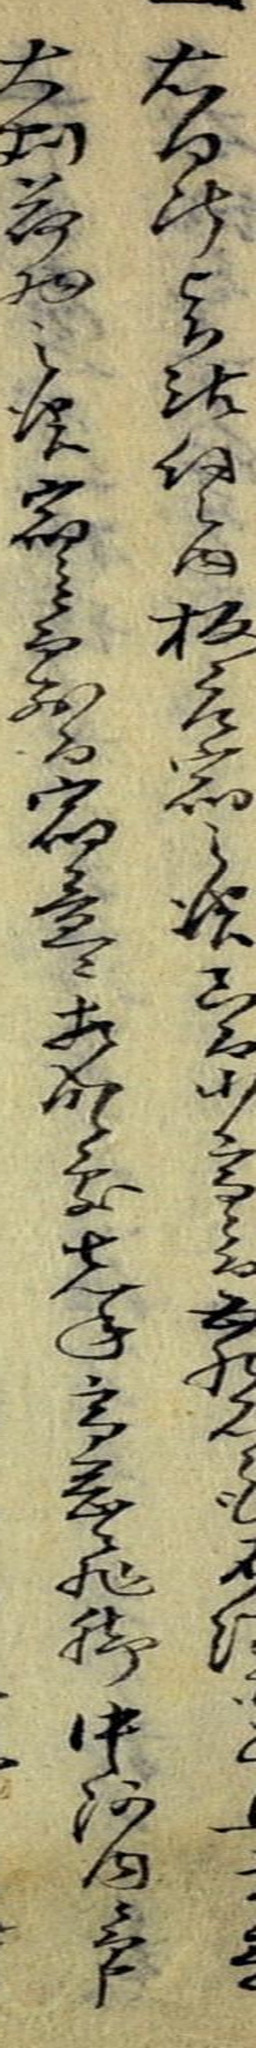大判荷物之儀は宿々に而別而宿益に相成候処先年高岡之飛脚中河内に而争
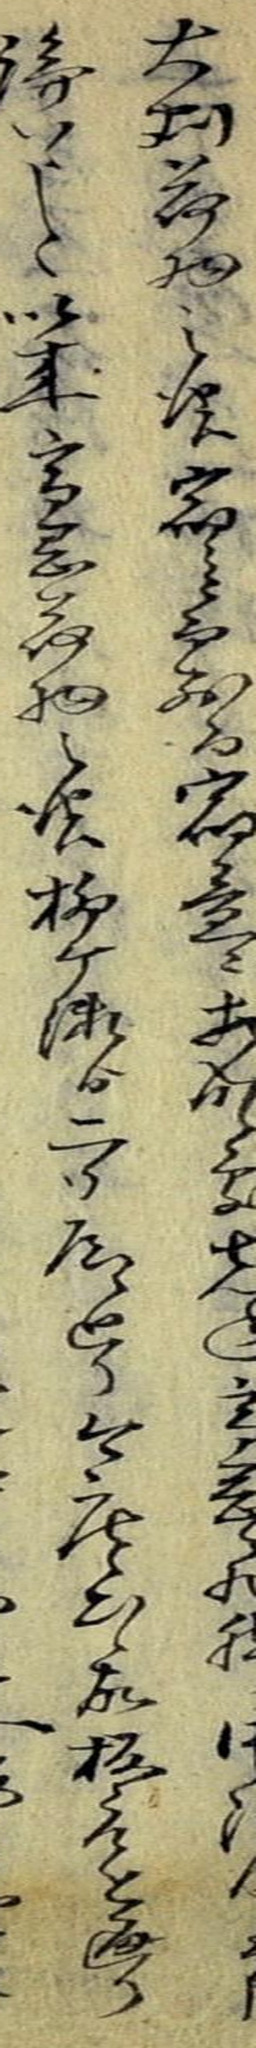論いたし以來高岡荷物之儀は柳ヶ瀬ゟ二ッ屋廻り今庄出候故板取を通り
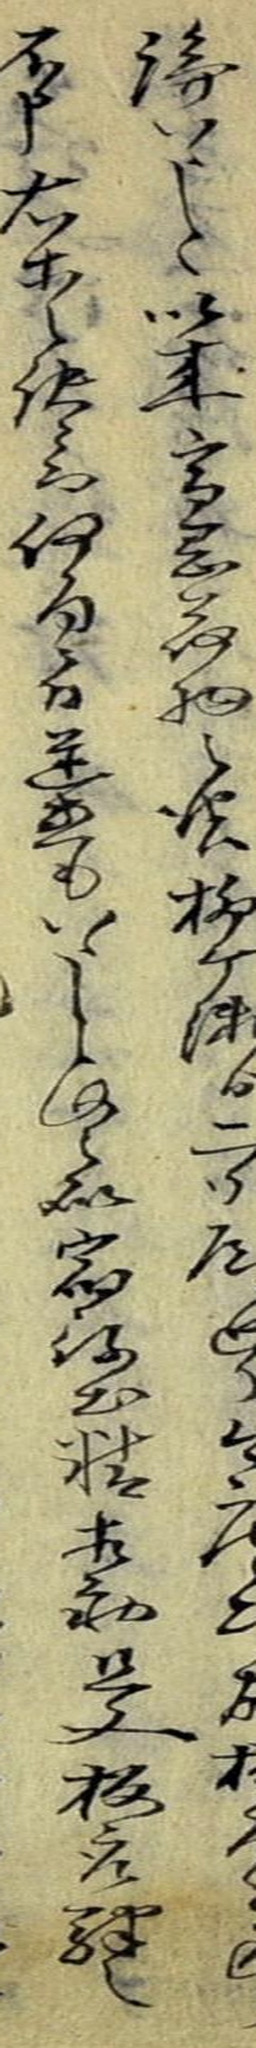不申右等之訳に而何角に付迷惑もいたし候趣候処宿致出精相勤且又板取駅之
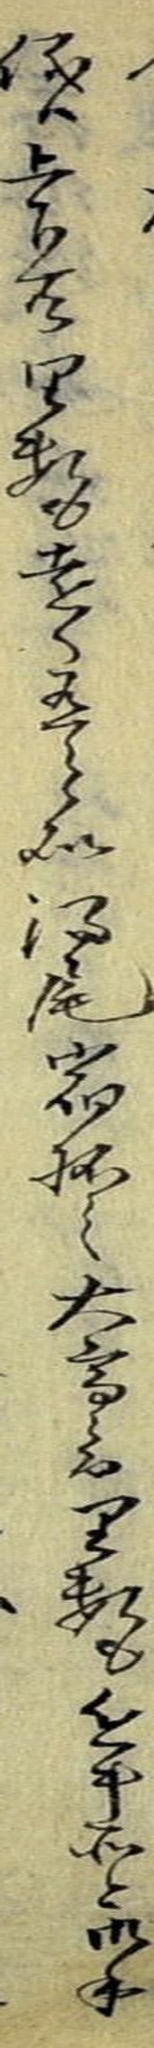儀は上下共里数も遠く有之候処湯尾宿抔之大高に而里数も近キ所と御手
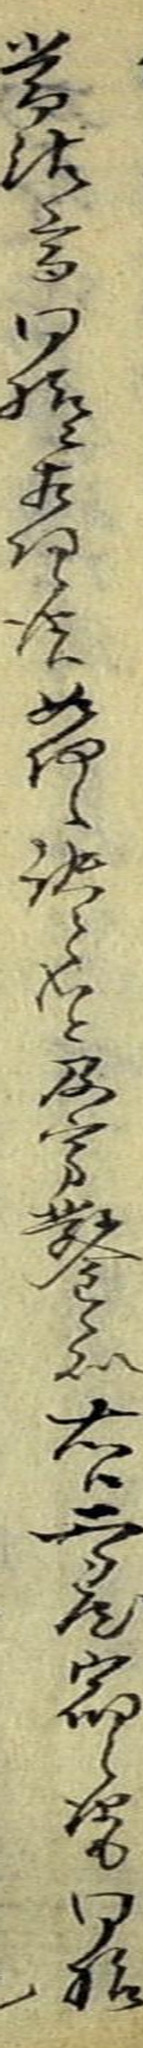当銀高同様に相伺候儀は如何之訳に候哉と及穿鑿処右は二ッ屋宿之儀も同様
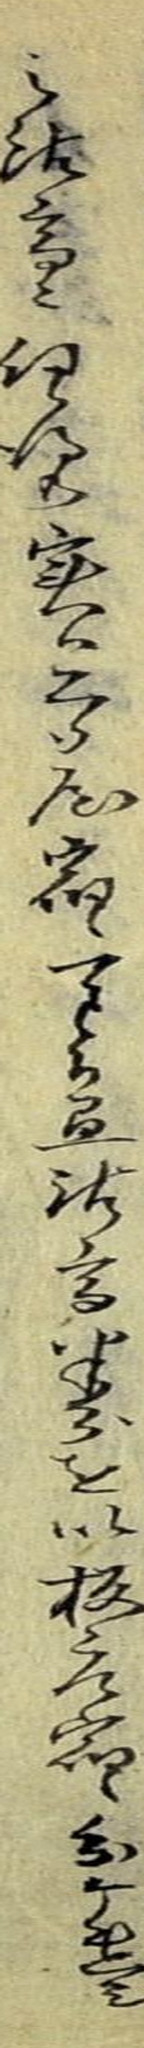之銀高に伺候得共実は二ッ屋宿へ可被下置銀高半分を以板取宿へ分ヶ遣し
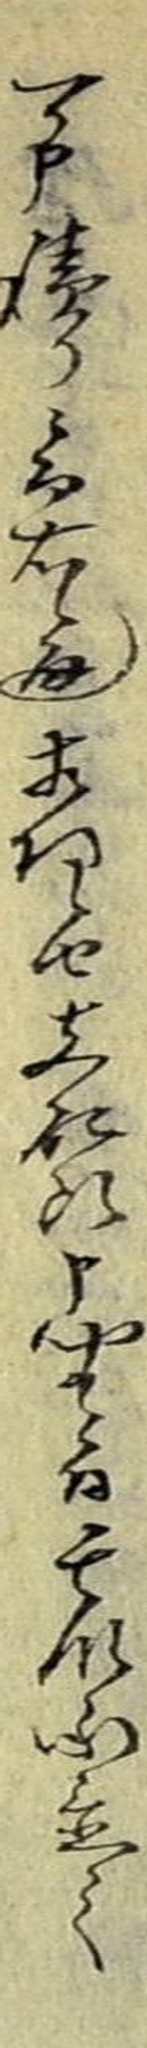可申積りに而右之通相伺候由支配頭申聞候に付其段承置之
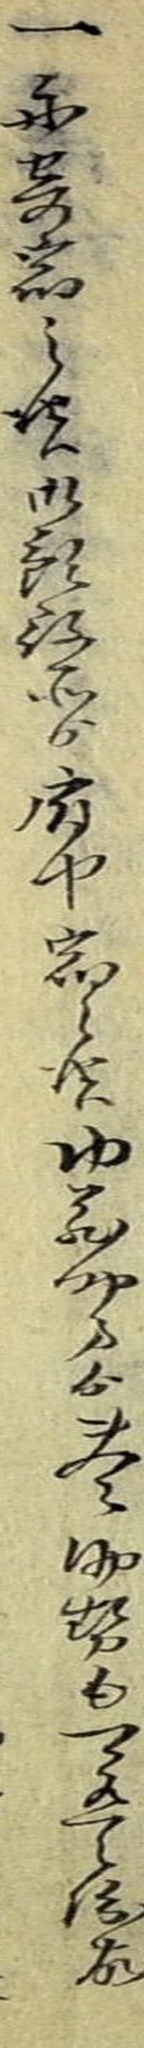一舟寄宿之儀御預役所ゟ府中宿之儀は内蔵助方ゟ夫々助勢も有之儀故
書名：命令之部 六
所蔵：福井県文書館 Fukui Prefectural Archives
